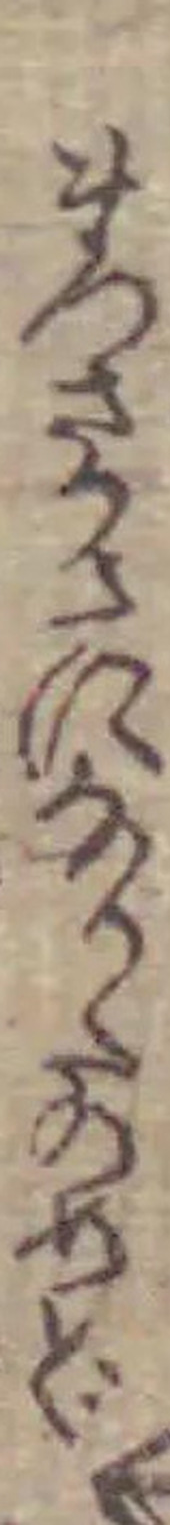まつさかさになりたのめど
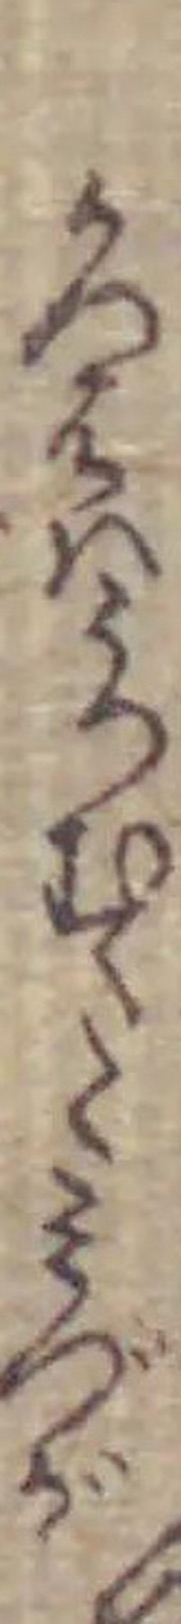かつははうつむくとみづが
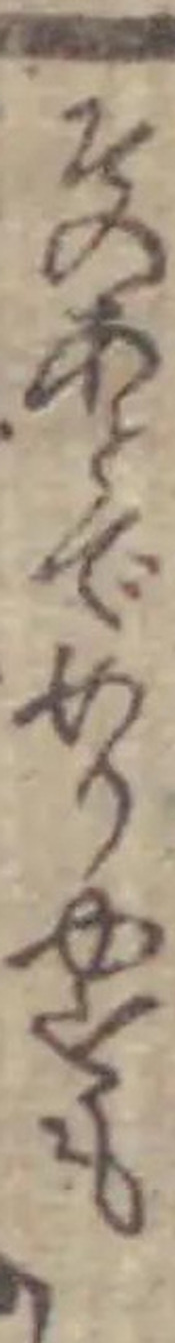そのあとでめりやすも
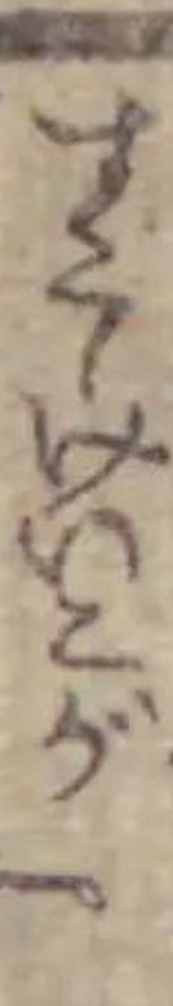すこしけいこが
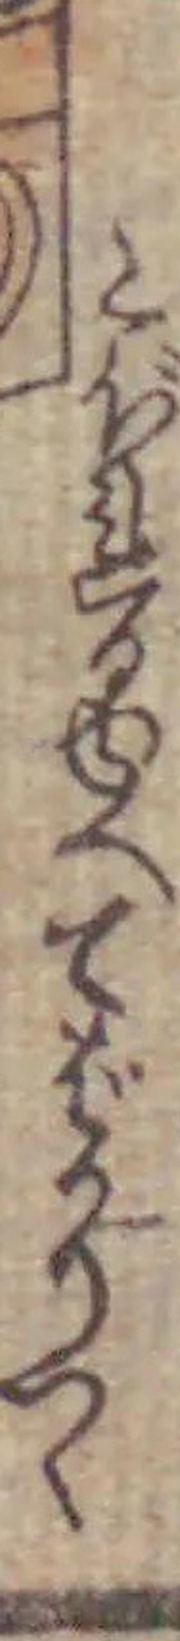こぼれるゆへてばかりつく
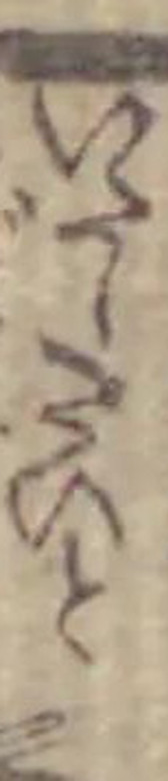いたしたいと
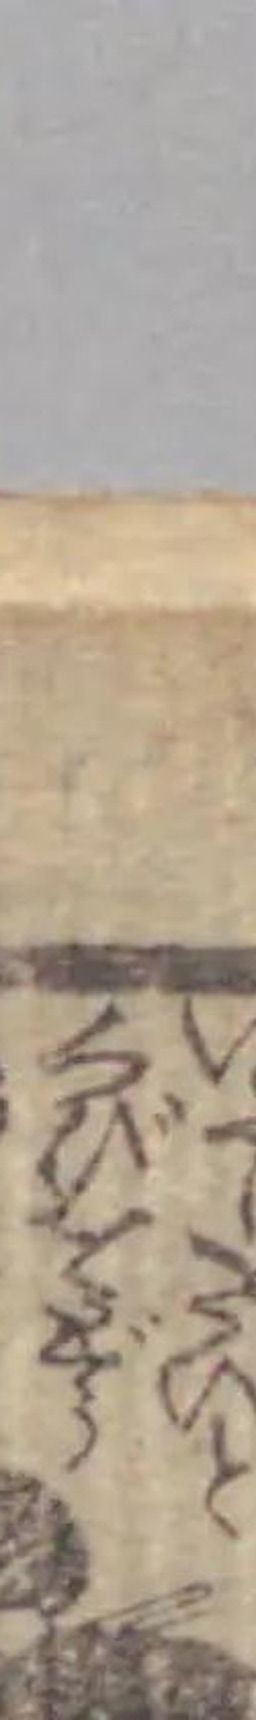くびをどう
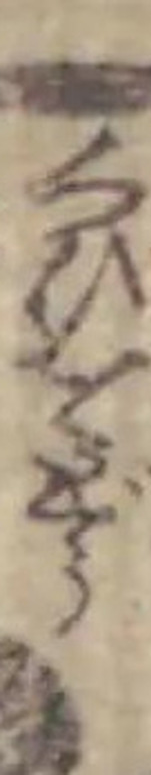くびをどう
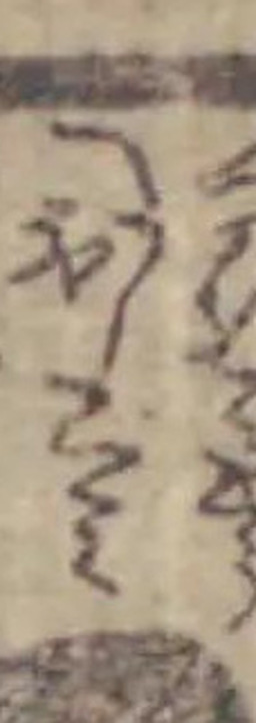へおしこみ
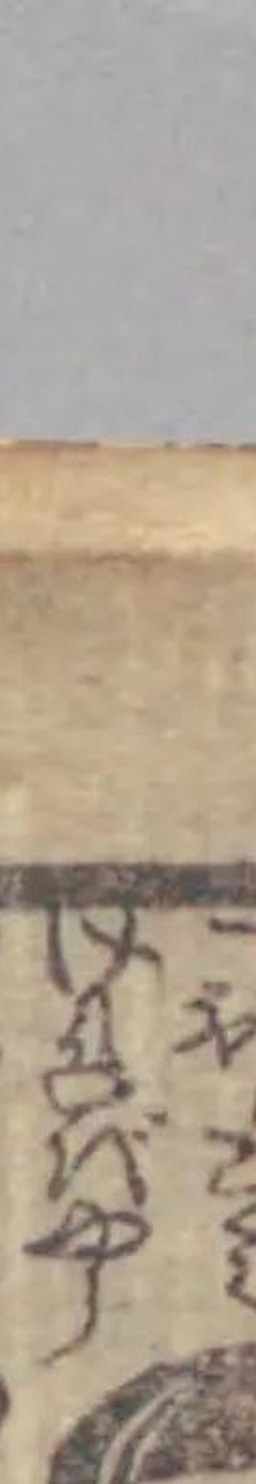ければやう
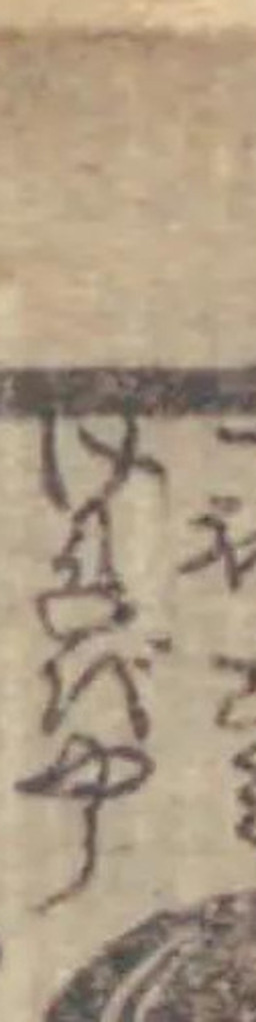ければやう
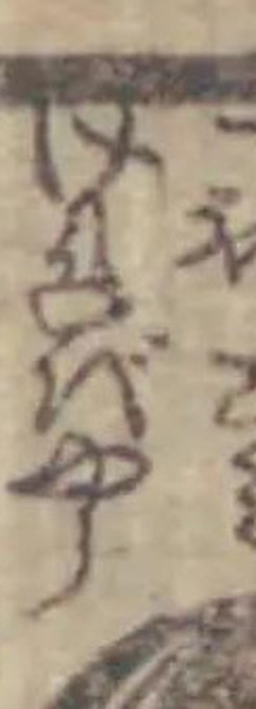ければやう
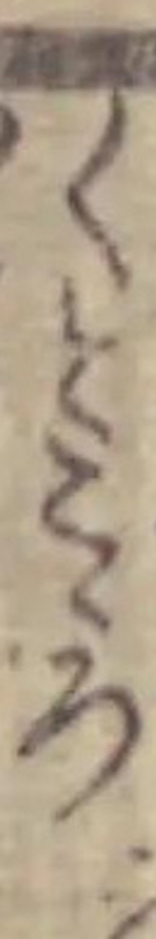〳〵とこゝろ
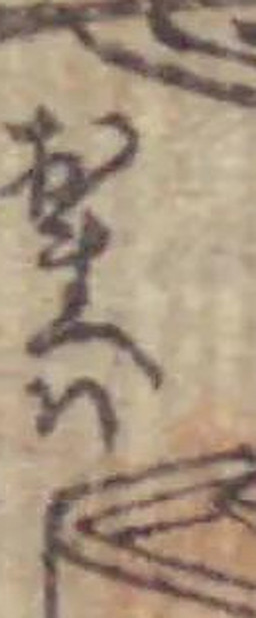おまへは
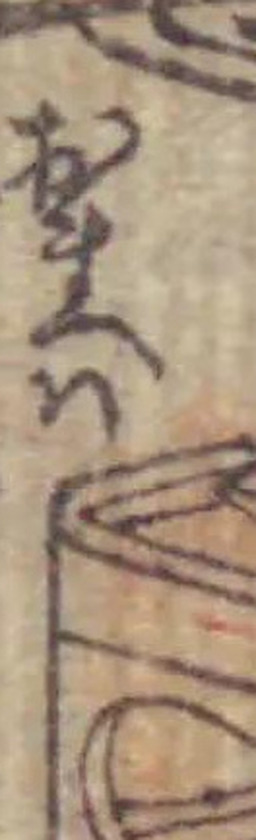おまへは
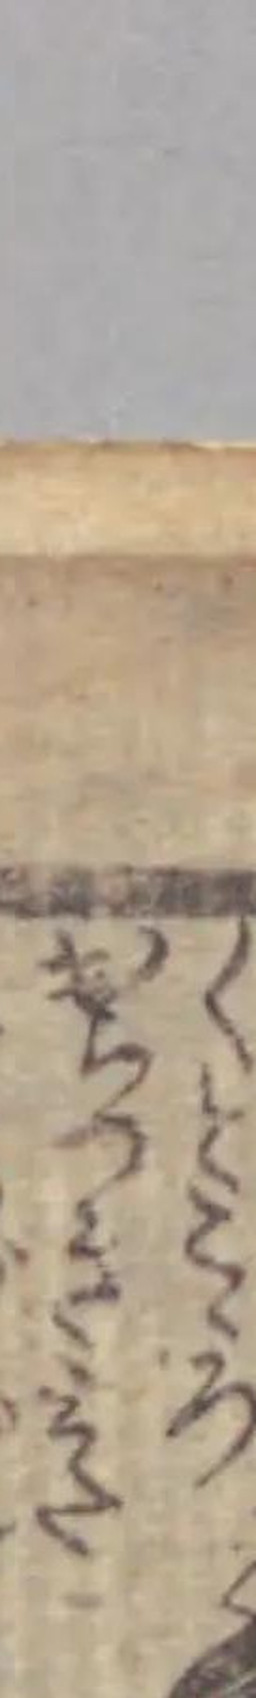おちつきみた
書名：化物昼寝鼾 2巻
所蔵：国立国会図書館 National Diet Library, JAPAN
